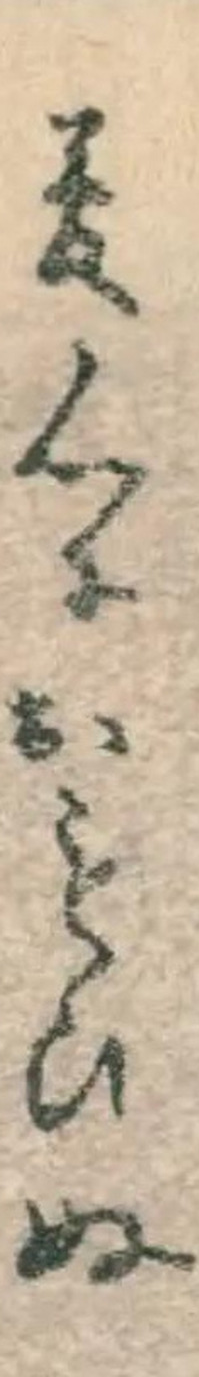夢心におもひぬ
